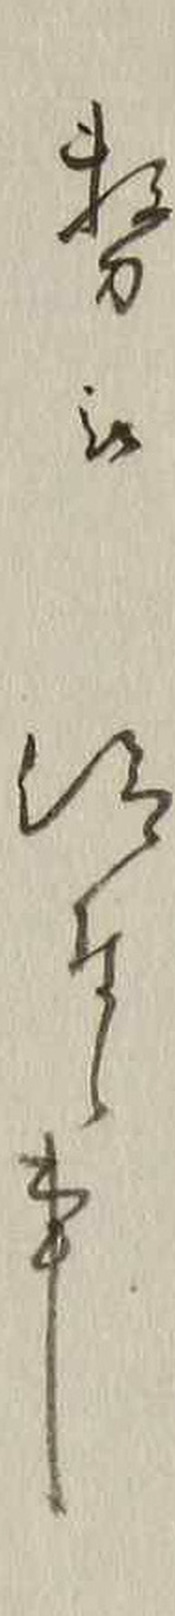務被仰付候事
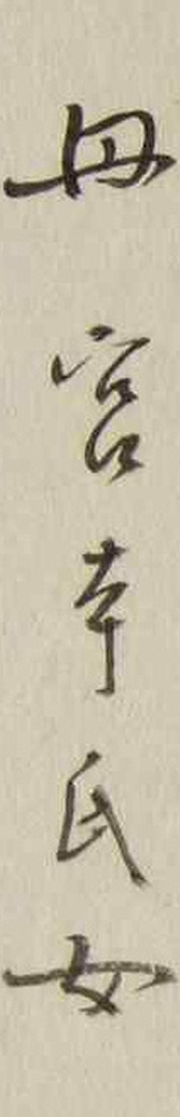母宮本氏女

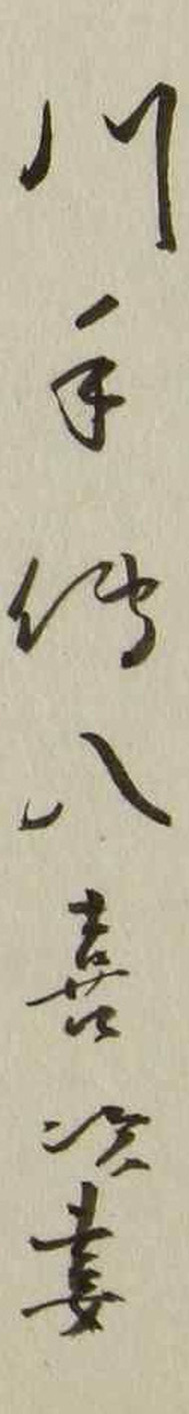女川手伝八喜次妻
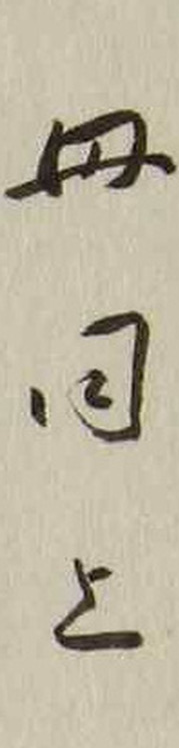母同上
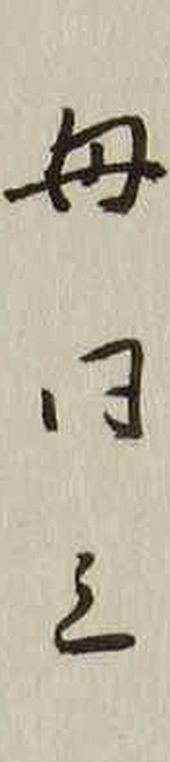母同上
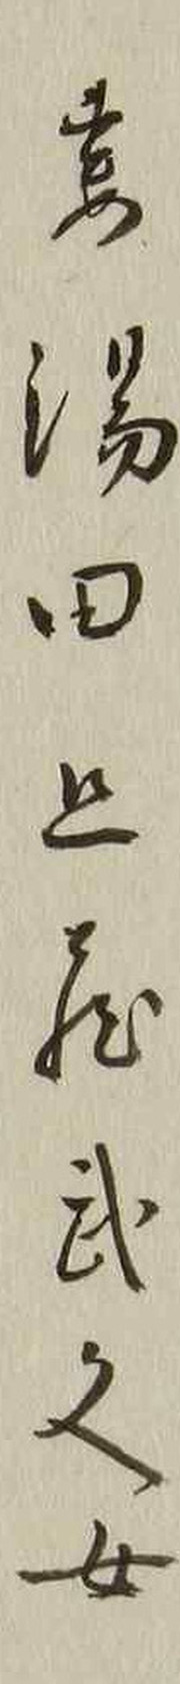妻湯田旦蔵武久女
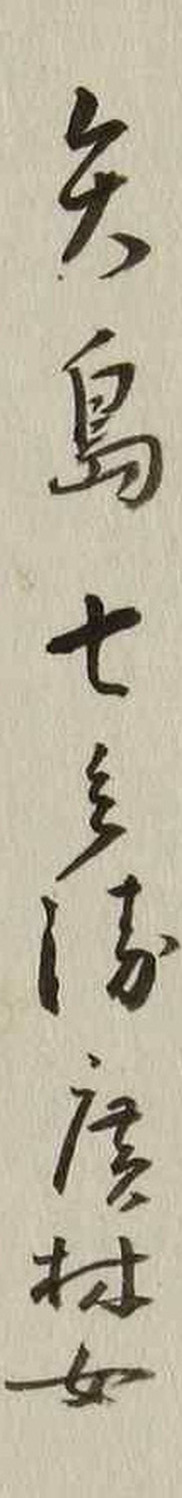矢島七兵衛広林女
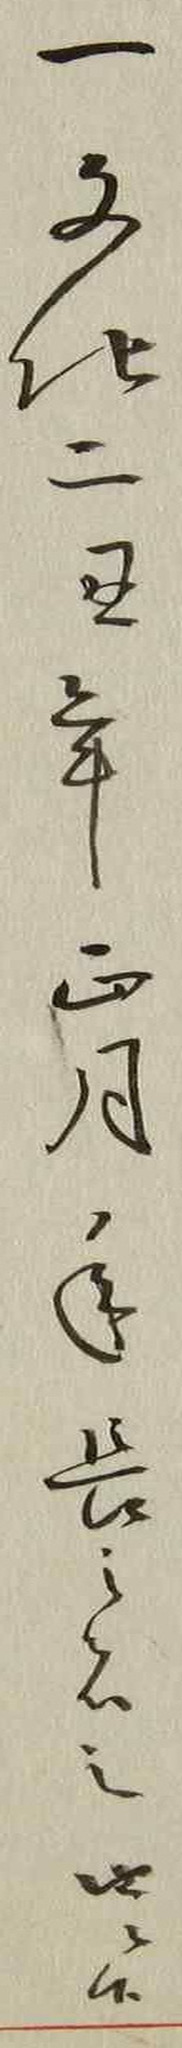一文化二丑年正月年長之者由ニ候
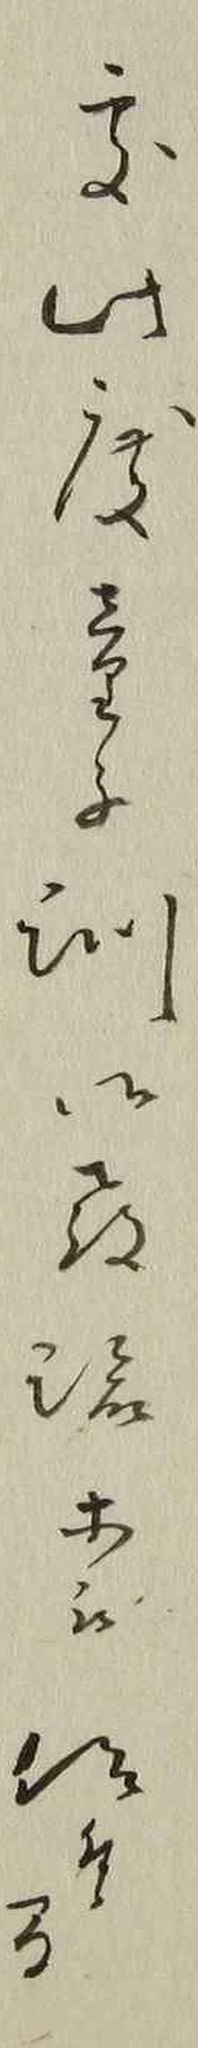処此度童子訓御教諭等被仰付候間
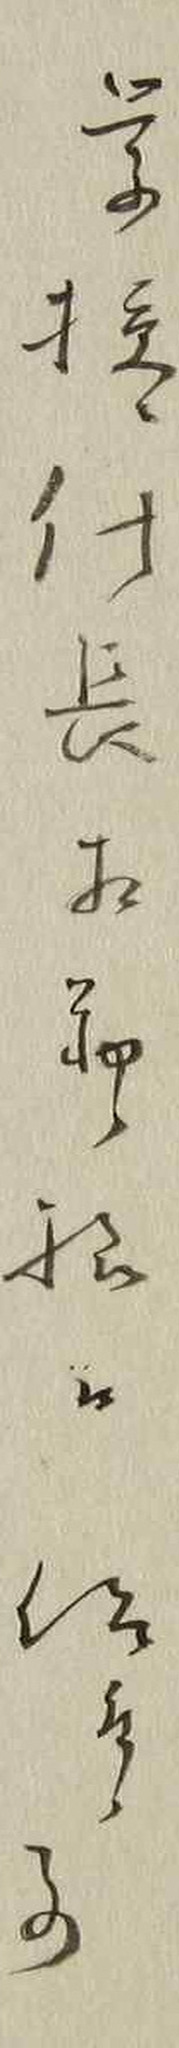学校ニ什長相勤候様被仰付候事
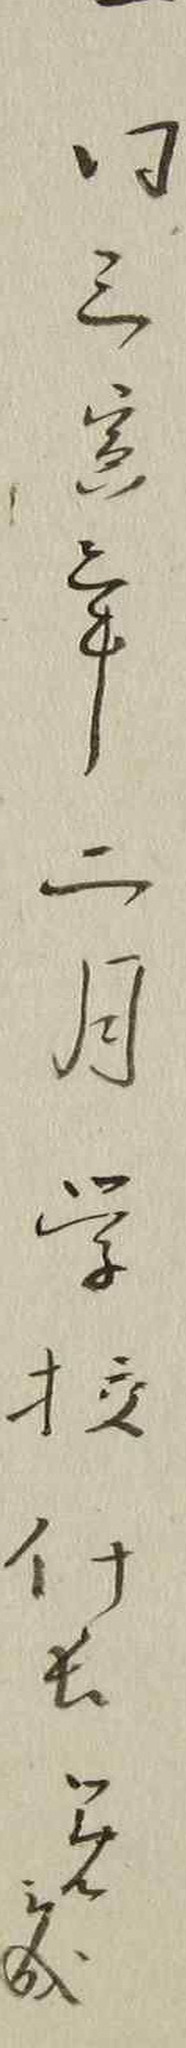一同三寅年二月学校什長御免被成
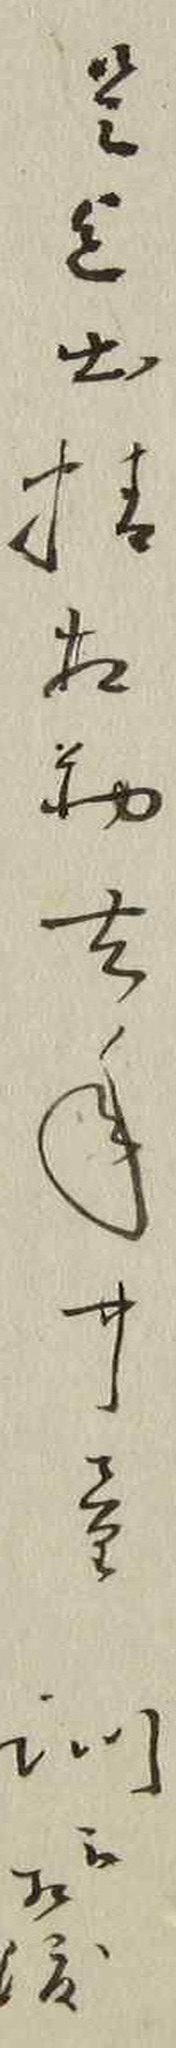是迄出精相勤去年中童訓被相渡
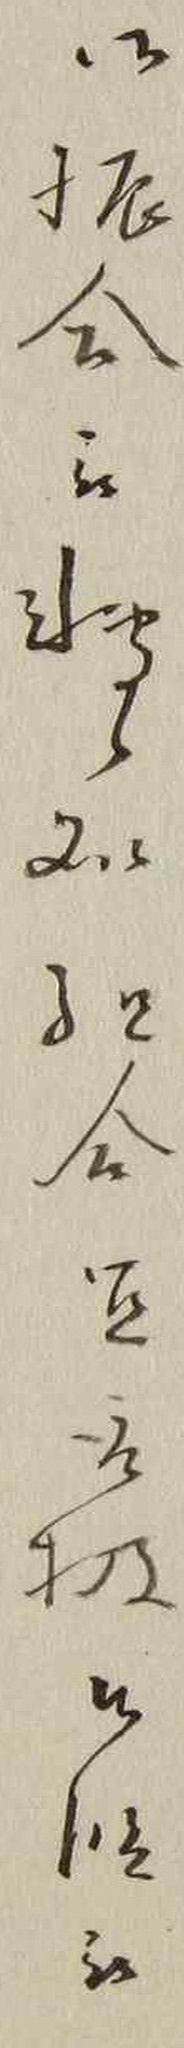御振合被転候処組合宜取扱候段被
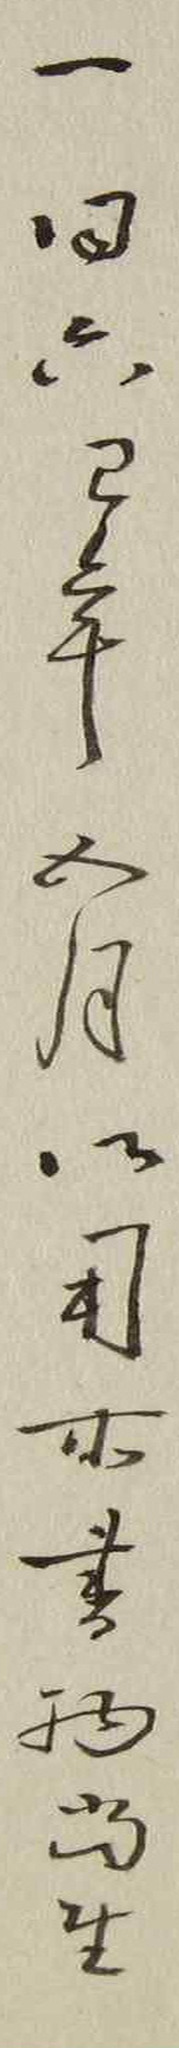一同六巳年五月御用所書物当座
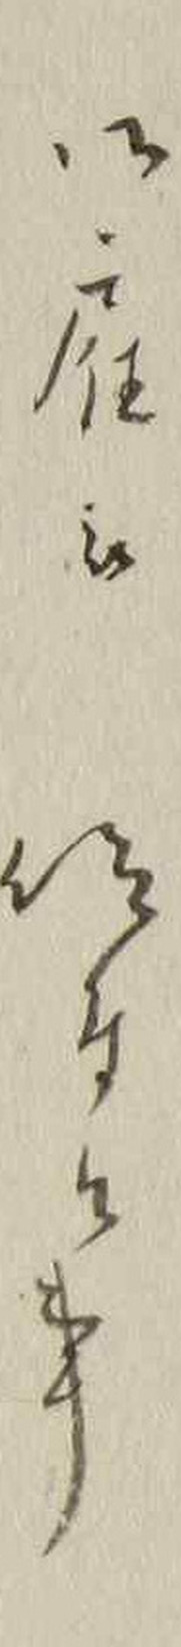御雇被仰付候事
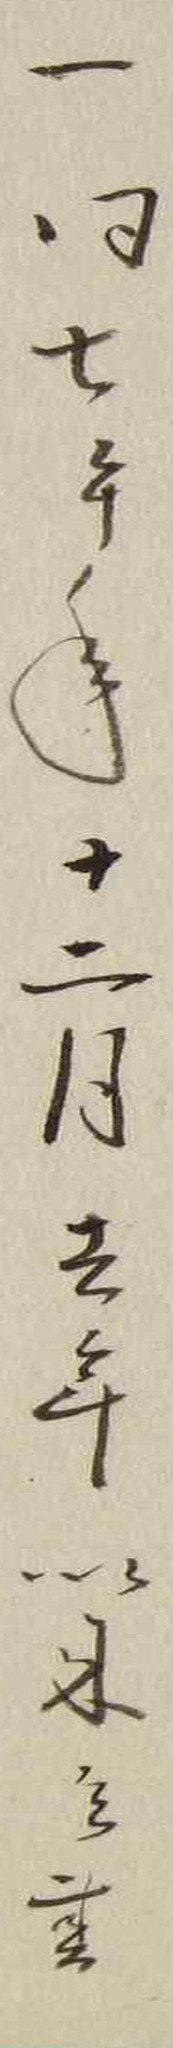一同七午年十二月去年已来兵書
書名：諸士系譜　巻之8　い之部8
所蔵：会津若松市立会津図書館
